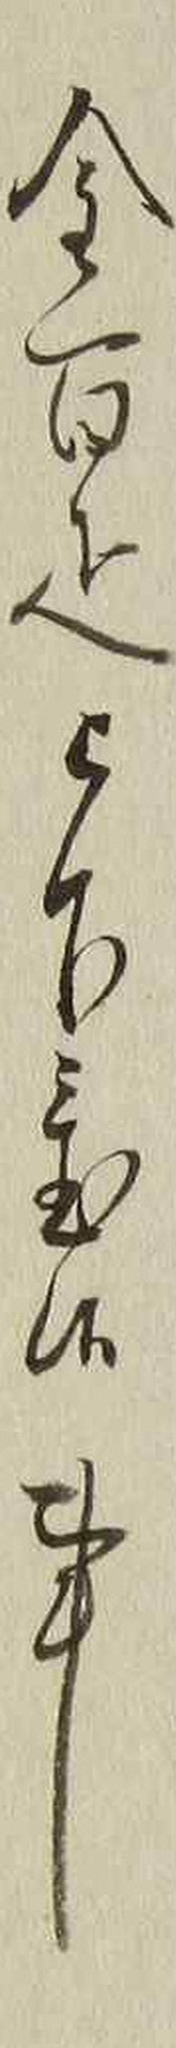金百疋被下置候事
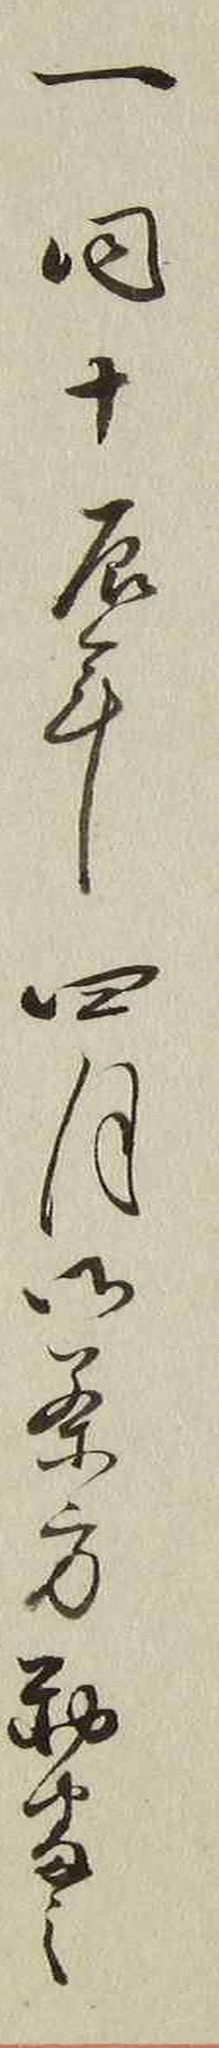一同十辰年四月御茶方勤番之
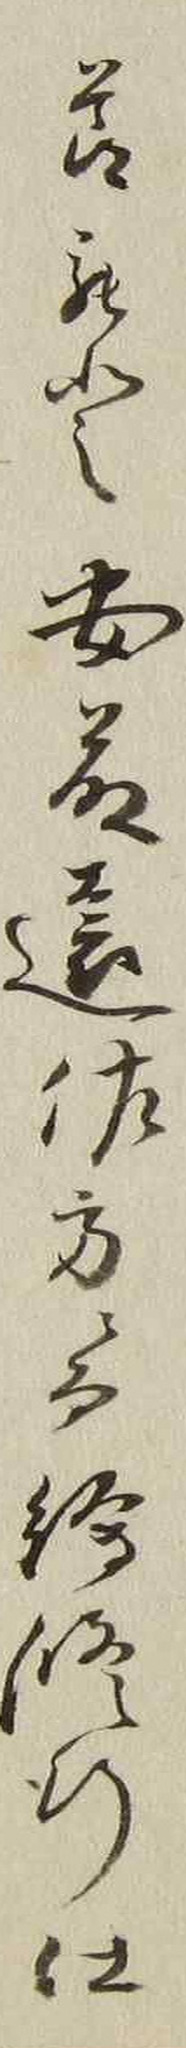節罷登安藤遠佐方ニ而絵修行仕
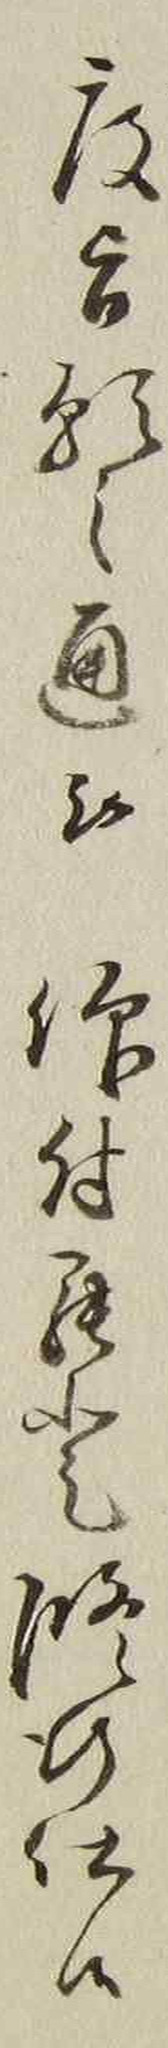度旨願之通被仰付罷登修行仕候
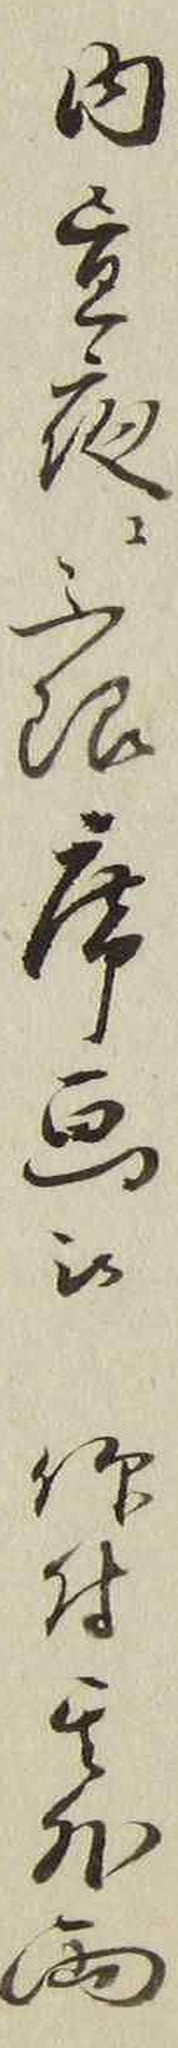内昼夜ニ不限席画被仰付其外両
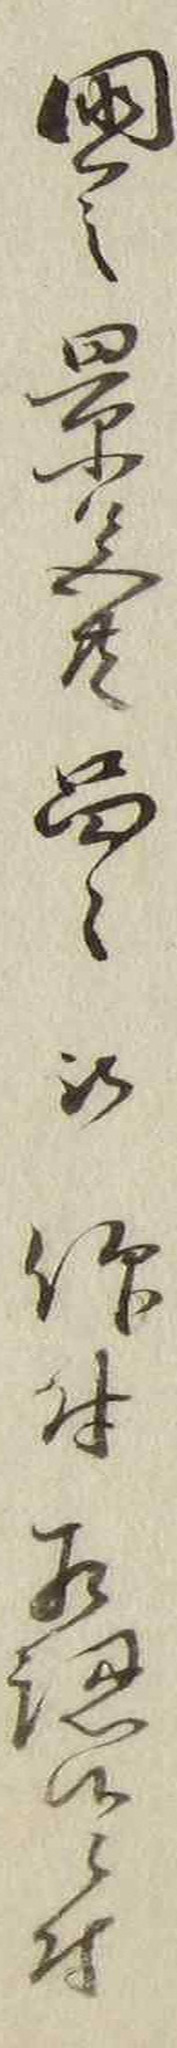国之景色共品々被仰付相認候ニ付
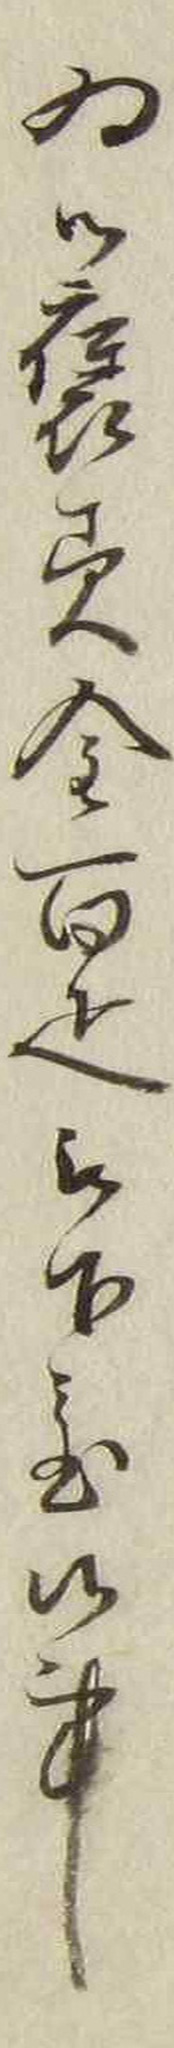為御褒美金百疋被下置候事

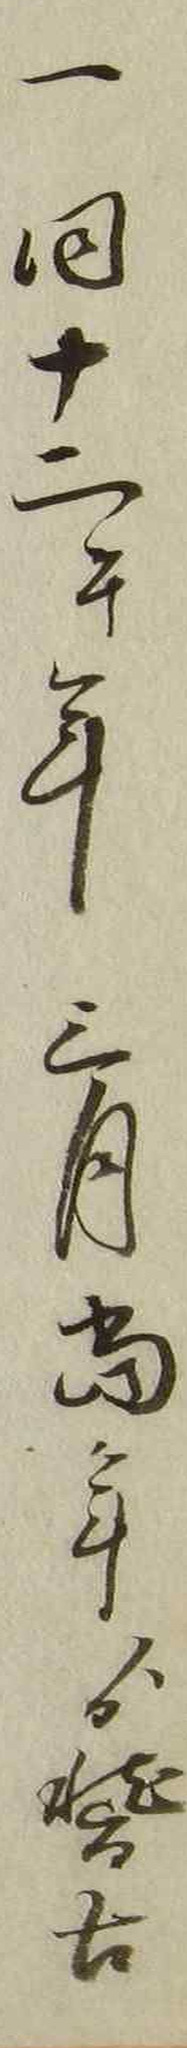一同十二午年三月当年ゟ稽古
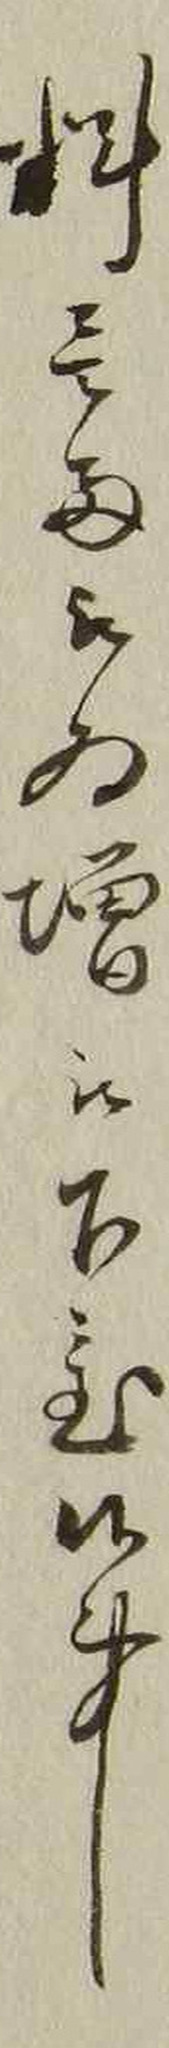料壱両被為増被下置候事
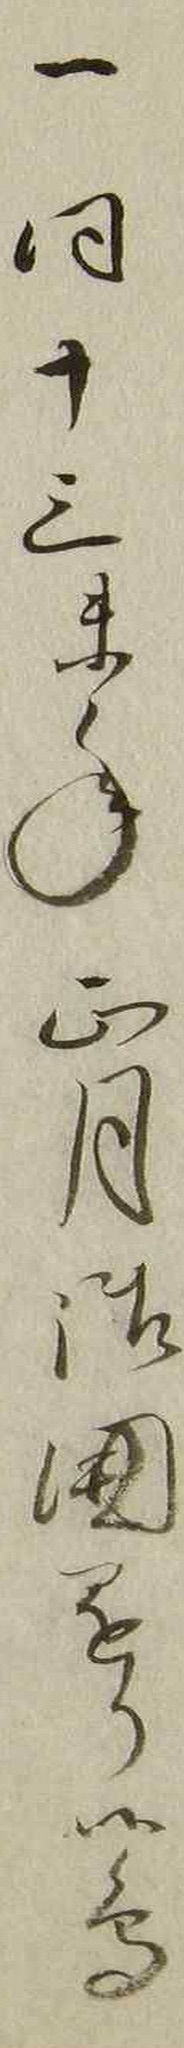一同十三未年正月御囲懸り御鳥
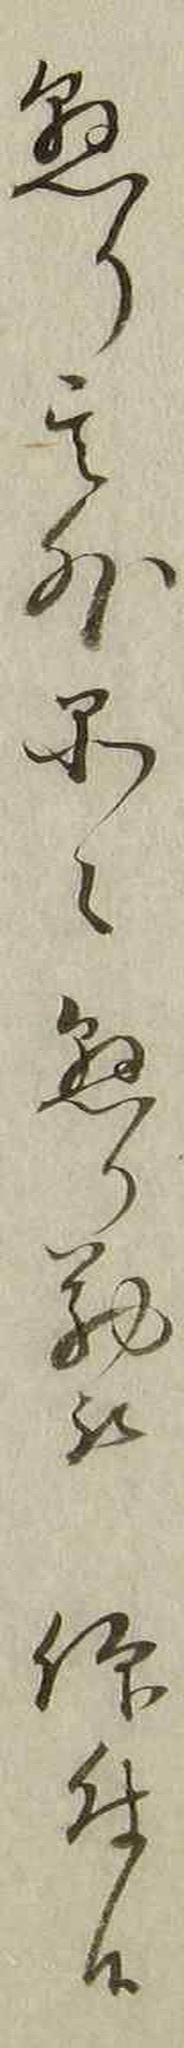懸り其外品々懸り勤被仰付候
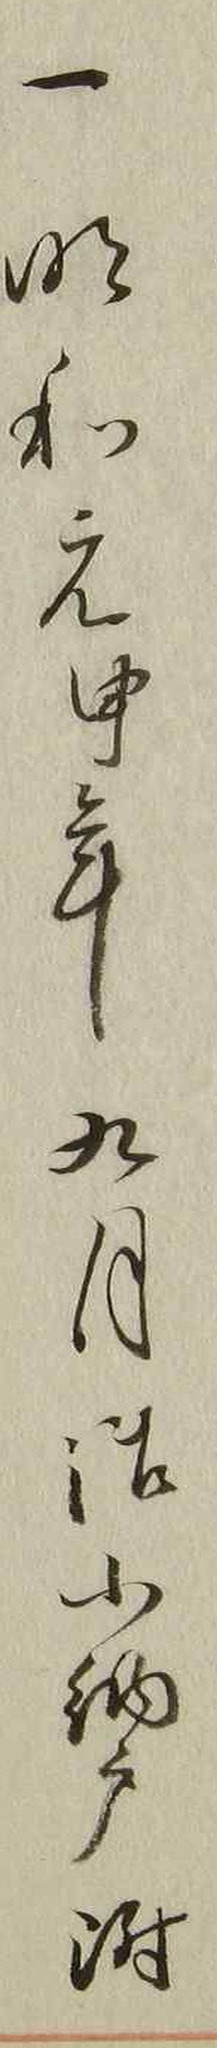一明和元申年九月御小納戸付
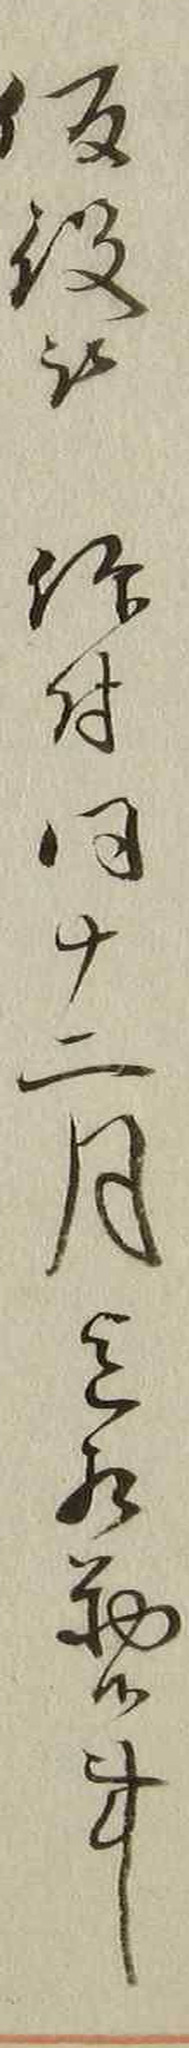仮役被仰付同十二月迄相勤候事
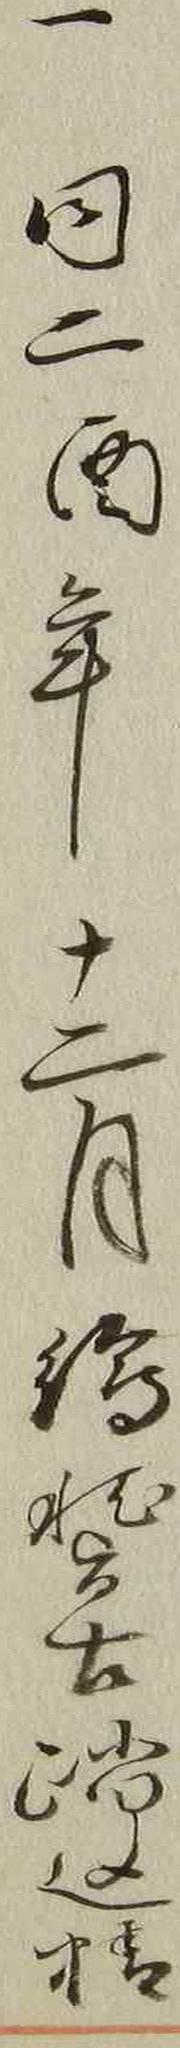一同二酉年十二月絵稽古踏込精
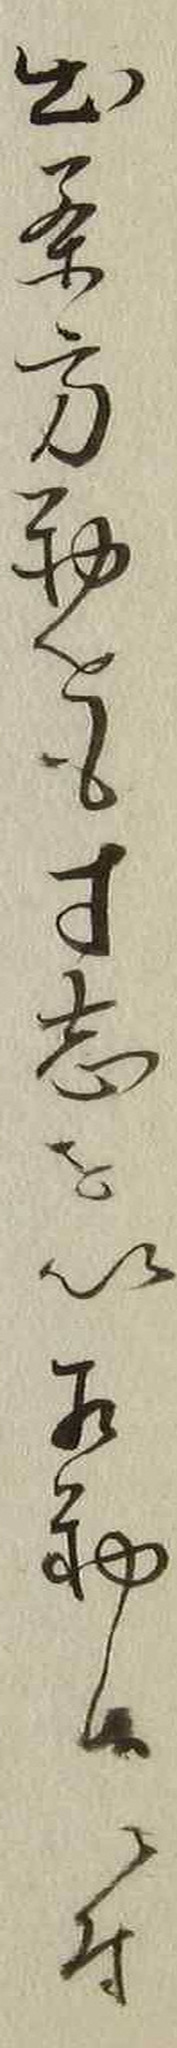出茶方勤をも寸志を以相勤候ニ付
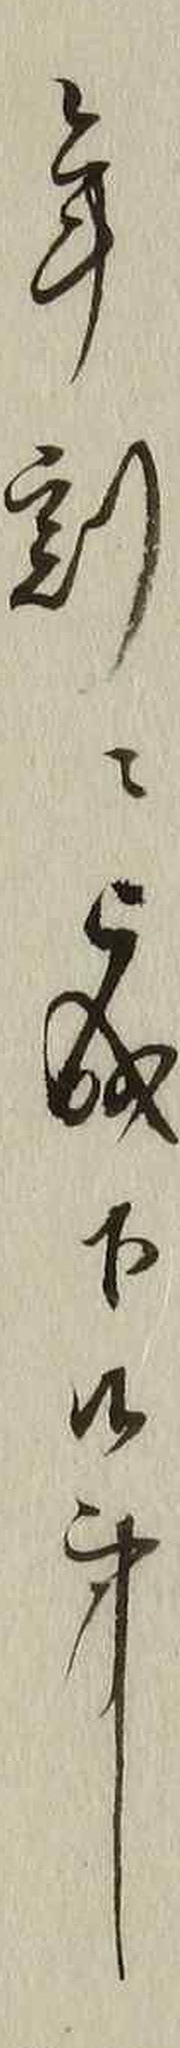年割ニ被成下候事
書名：諸士系譜　巻之132　た之部8
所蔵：会津若松市立会津図書館
